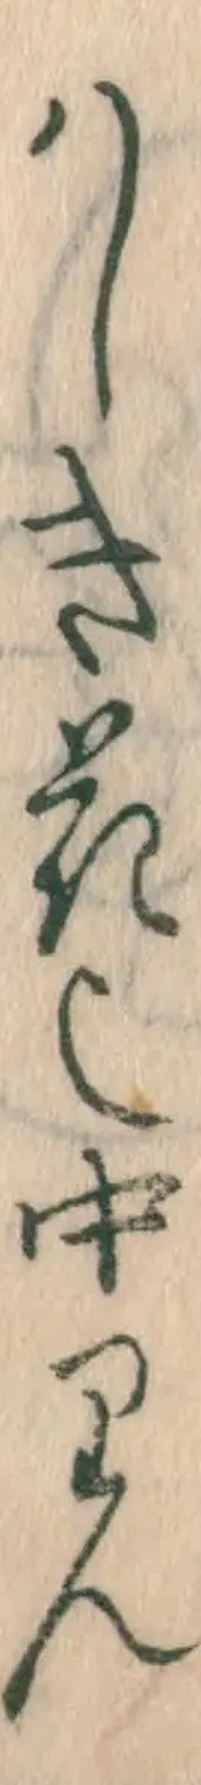はしき花也中りん

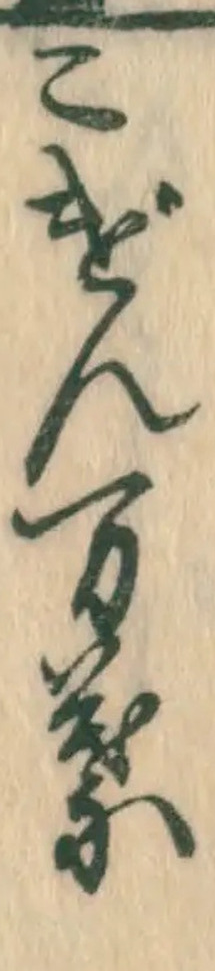こげん万葉
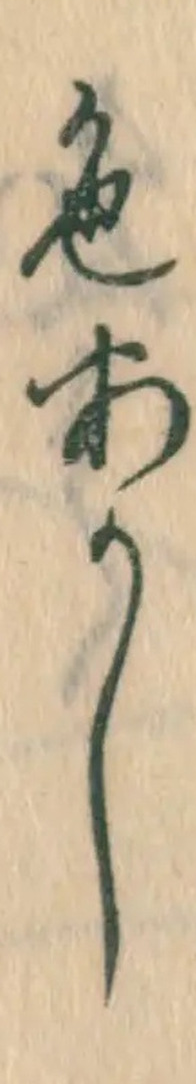色あかし
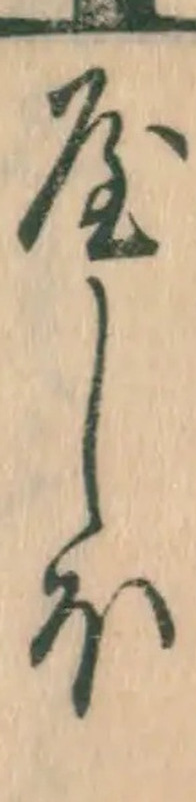やしほ
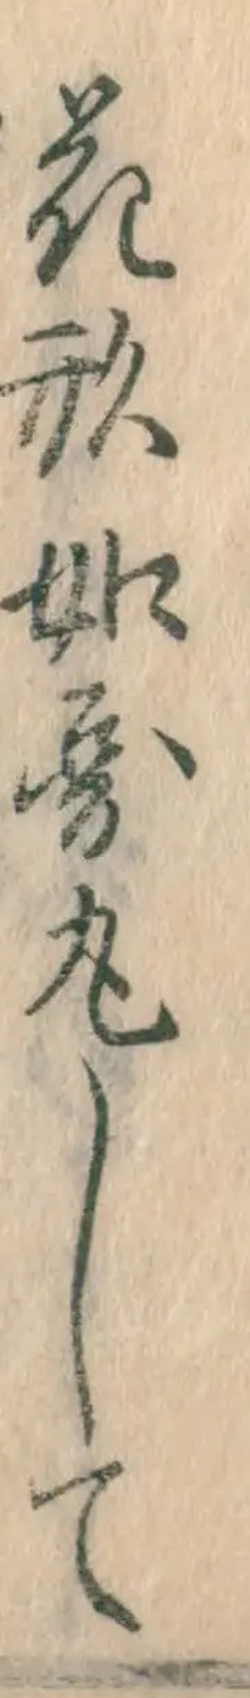花形如図丸して
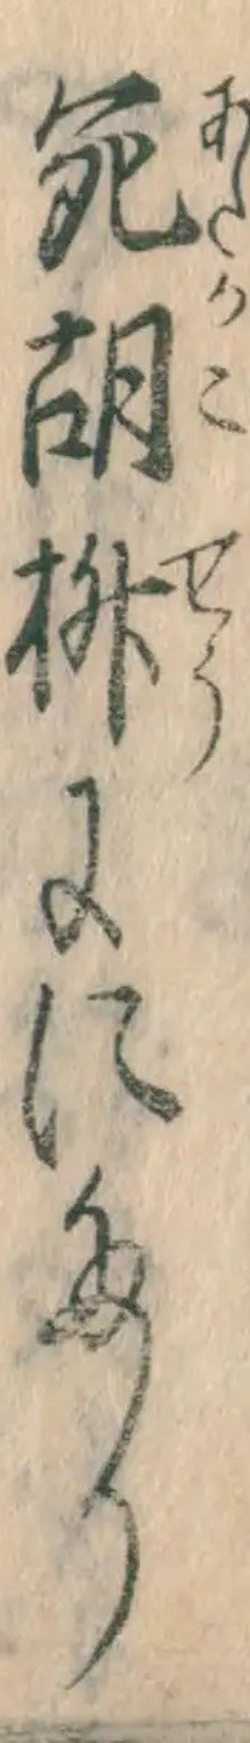宛胡椒ににたり
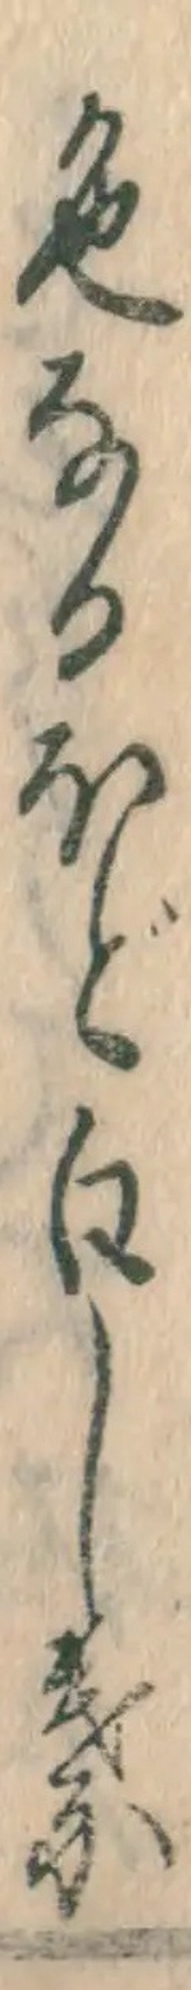色なるほど白し

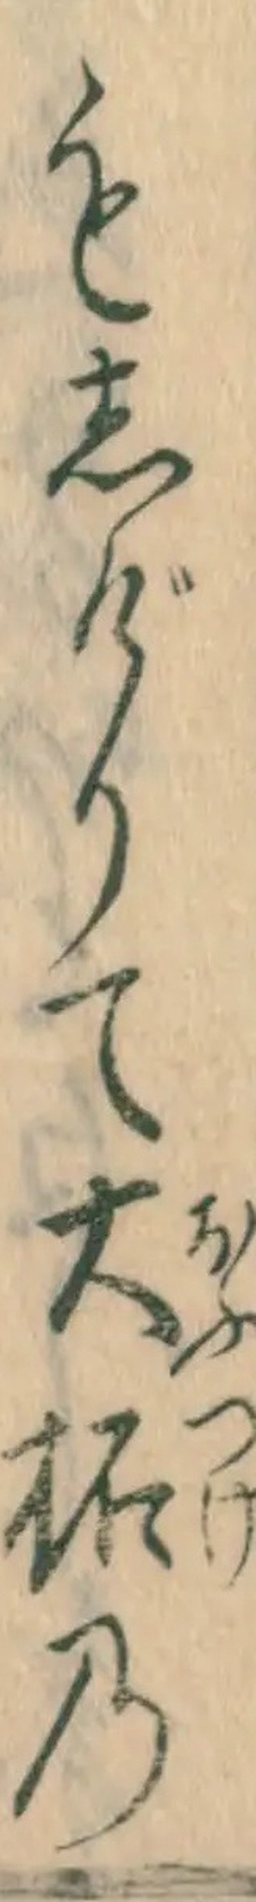もしだりて大柘の
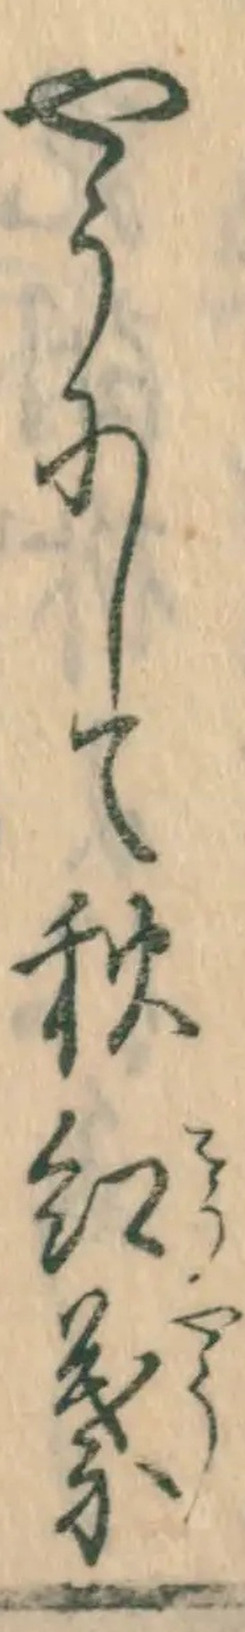やうにして秋紅葉
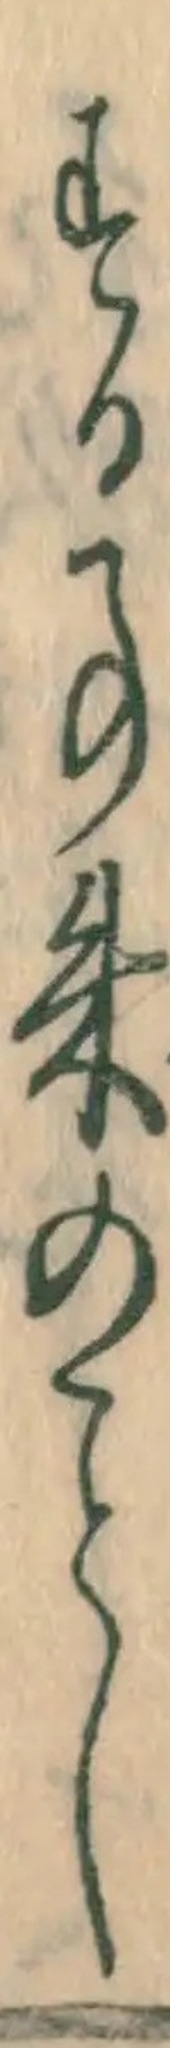する事朱のことし
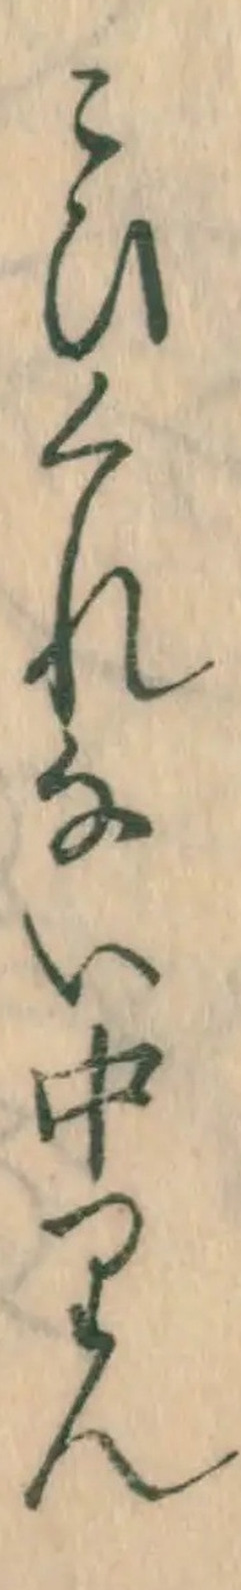こひくれない中りん
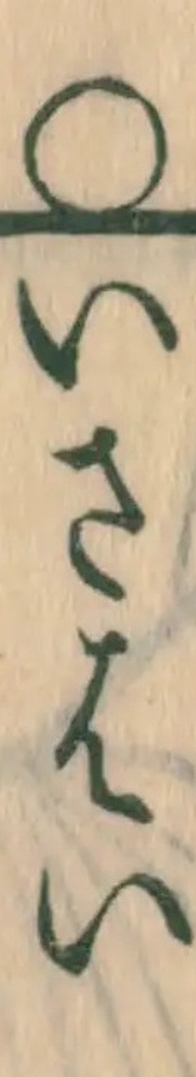○いさはい
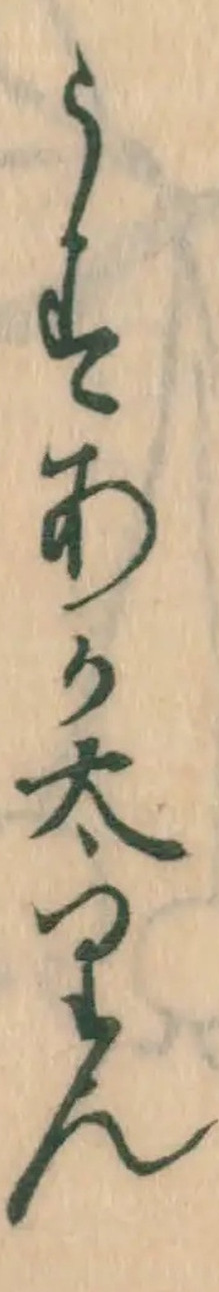うすあか太りん
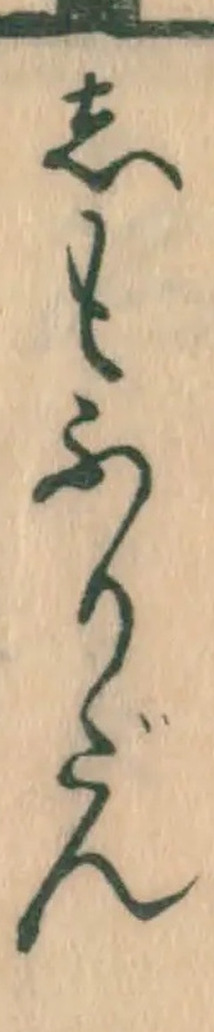しもふりだん
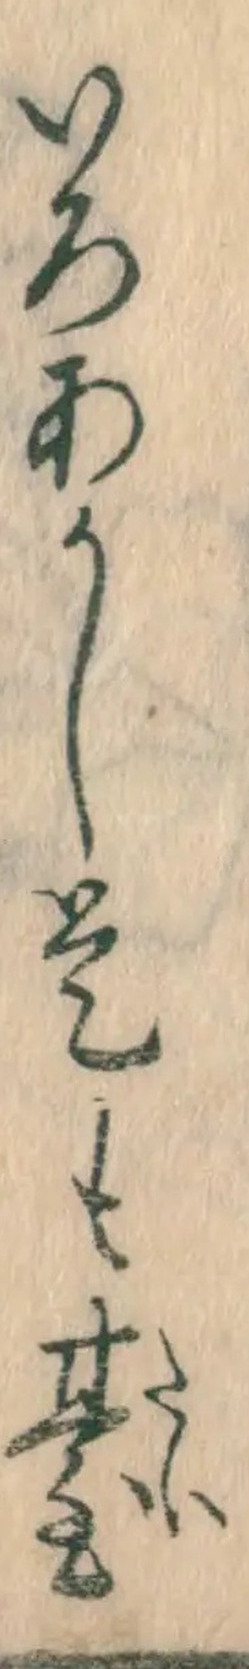いろあかし是も臺
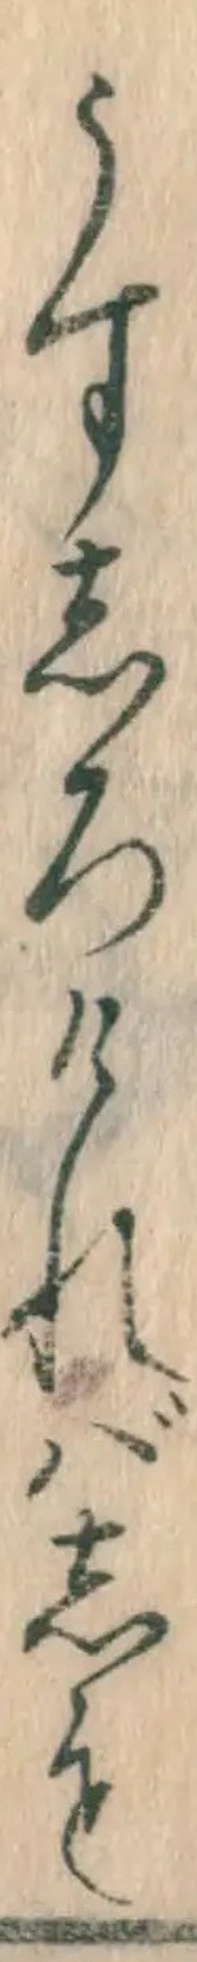うすしろければしも
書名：錦繍枕 5巻. [1]
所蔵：国立国会図書館 National Diet Library, JAPAN
